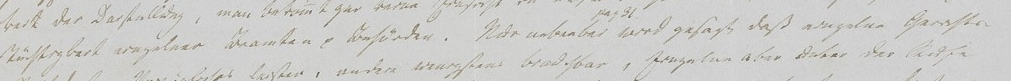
Tüchtigkeit einzelner Beamten & Behörden. Nur nebenbei pag 31 wird gesagt, daß einzelne Gerichts--
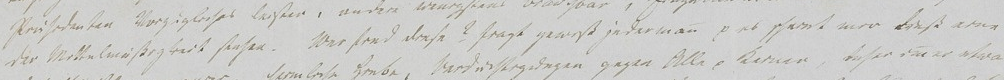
der Mittelmäßigkeit stehen. Wer sind diese? fragt gewiß jedermann & es scheint mir dieß eine
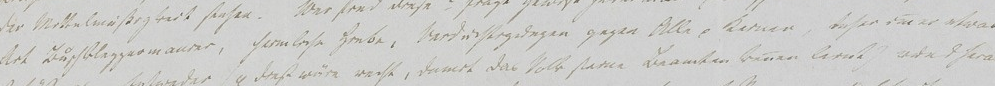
Art Buschklappermanier, harmlose Hiebe, Verdächtigungen gegen Alle & Keinen, daher immer etwas
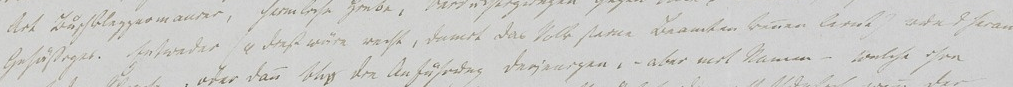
Gehässiges. Entweder (& dieß wäre recht, damit das Volk seine Beamten kennen lernt) rund heraus
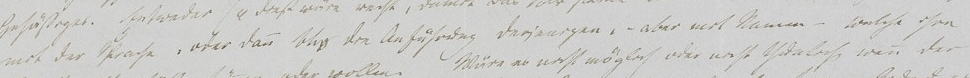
mit der Sprache, oder dann blos die Anführung derjenigen, – aber mit Namen – welche ihre
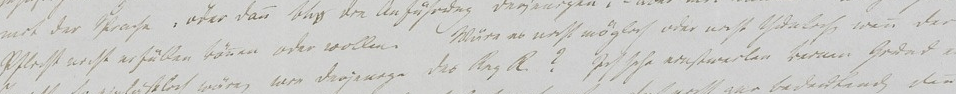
Pflicht nicht erfüllen können oder wollen. Wäre es nicht möglich oder nicht thunlich wenn der
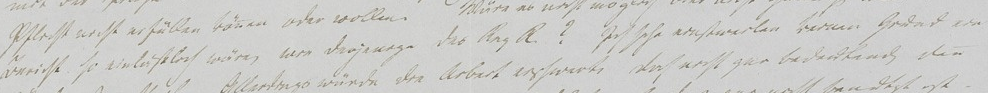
Bericht so einläßlich wäre, wie derjenige des RegR? Ich sehe einstweilen keinen Grund ein
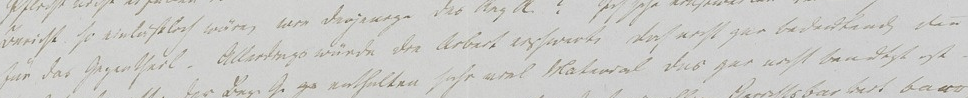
für das Gegentheil. Allerdings würde die Arbeit erschwert, doch nicht gar bedeutend, denn
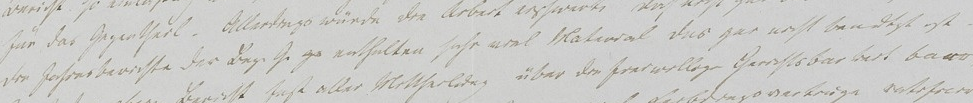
die Jahresberichte der Bez.G. enthalten sehr viel Material das gar nicht benutzt ist.
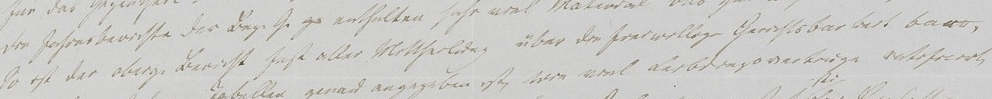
So ist der oberg. Bericht fast aller Mittheilung über die freiwillige Gerichtsbarkeit baar,
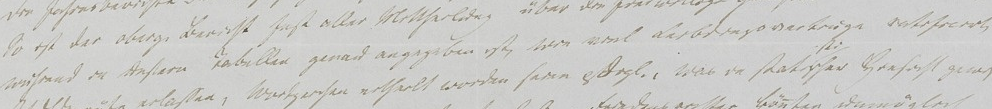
während in unsern Tabellen genau angegeben ist, wie viel Leibdingsverträge ratificirt,
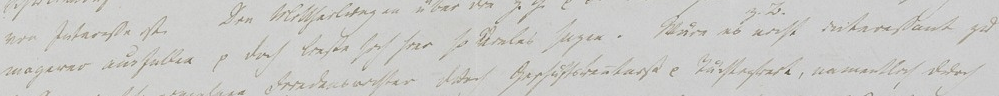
magerer ausfallen & doch ließe sich hier so Vieles sagen. Wäre es z. B. nicht interessant zu
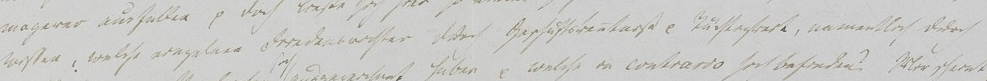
wissen, welche einzelnen Friedensrichter durch Geschäftskenntniß & Tüchtigkeit, namentlich durch
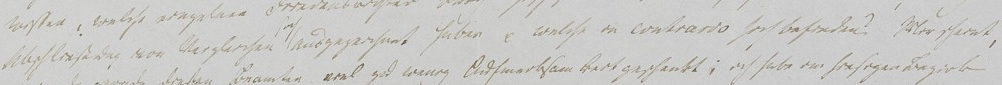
Abschließung von Vergleichen sich ausgezeichnet haben & welche in contrario sich befinden? Mir scheint,
